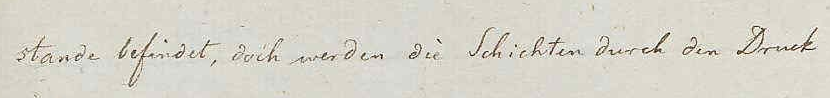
stande befindet, doch werden die Schichten durch den Druck
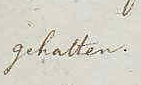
gehalten.
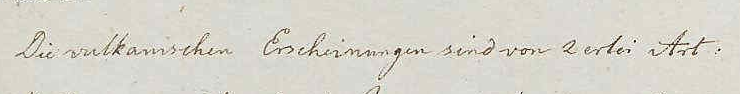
Die vulkanischen Erscheinungen sind von 2erlei Art:
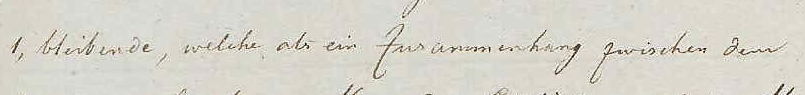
1, bleibende, welche als ein Zusammenhang zwischen dem
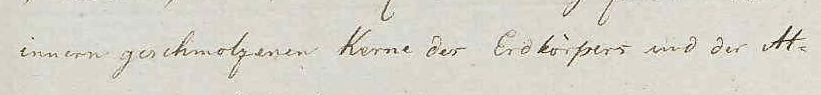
innern geschmolzenen Kerne des Erdkörpers und der At-
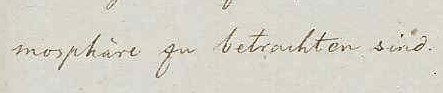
mosphäre zu betrachten sind.
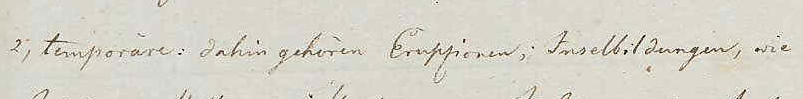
2, temporäre: dahin gehören Erupzionen, Inselbildungen, wie
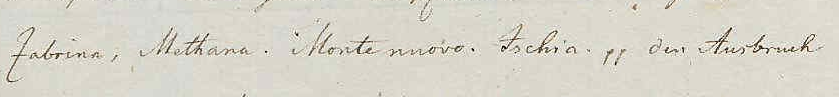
Zabrina, Methana. Monte nuovo. Ischia. pp Ausbruch
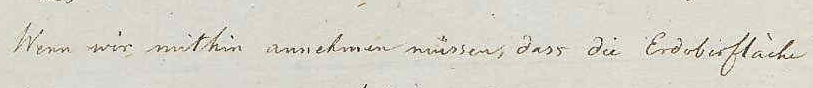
Wenn wir mithin annehmen müssen, dass die Erdoberfläche
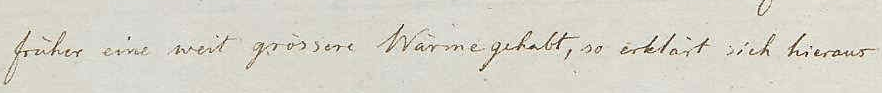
früher eine weit grössere Wärme gehabt, so erklärt sich hieraus
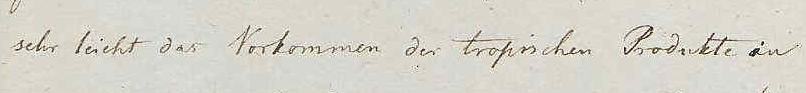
sehr leicht das Vorkommen der tropischen Produkte in
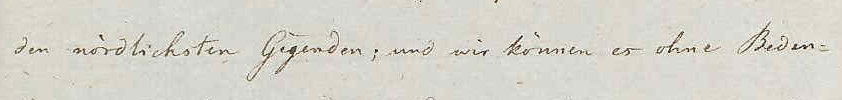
den nördlichsten Gegenden; und wir können es ohne Beden-
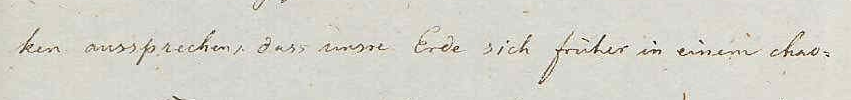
ken aussprechen, dass unsre Erde sich früher in einem chao-
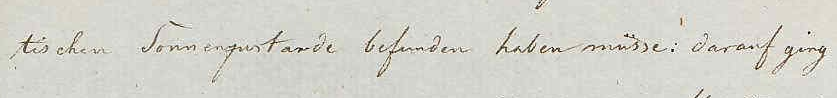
tischen Sonnenzustande befunden haben müsse: darauf ging
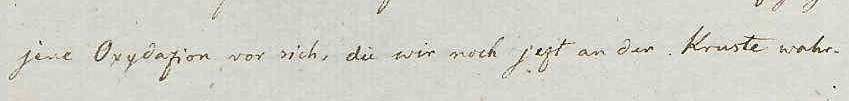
jene Oxydazion vor sich, die wir noch jezt an der Kruste wahr-
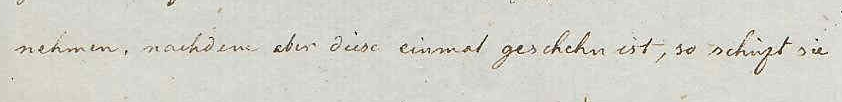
nehmen, nachdem aber diese einmal geschehn ist, so schüzt sie
